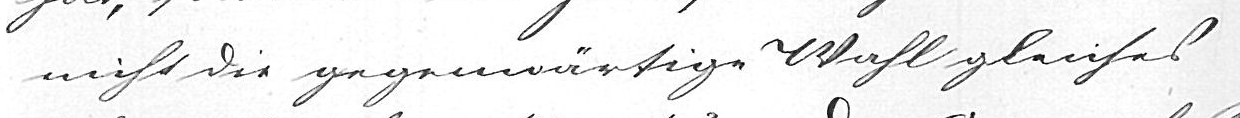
nicht die gegenwärtige Wahl gleiches
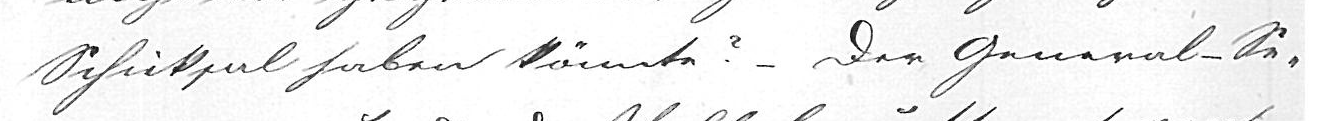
Schicksal haben könnte? Der General-Se-
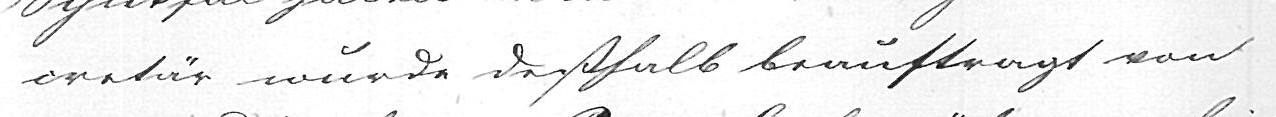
cretär wurde deßhalb beauftragt von
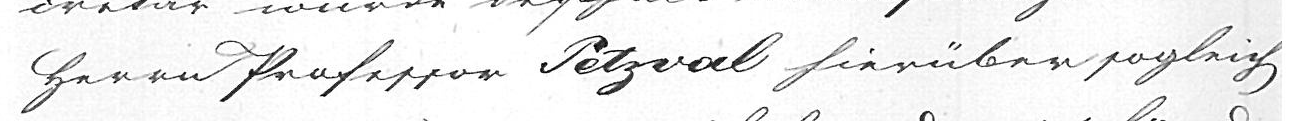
Herrn Professor Petzval hierüber sogleich
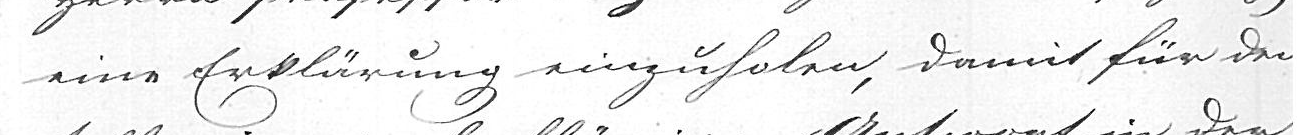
eine Erklärung einzuholen, damit für den
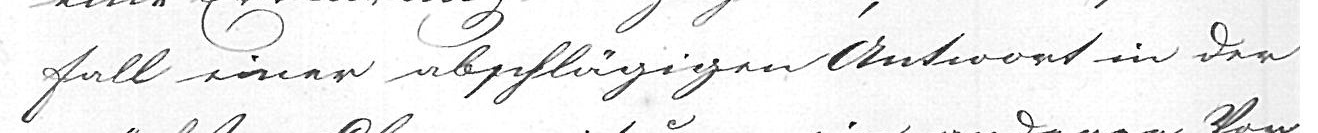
Fall einer abschlägigen Antwort in der
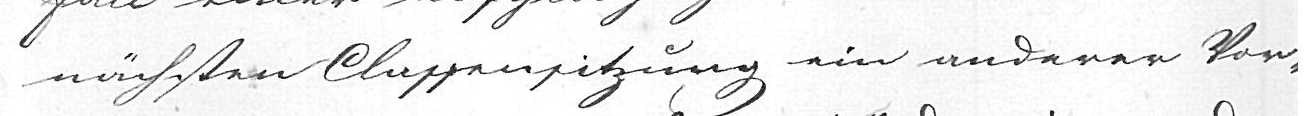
nächsten Classensitzung ein anderer Vor-
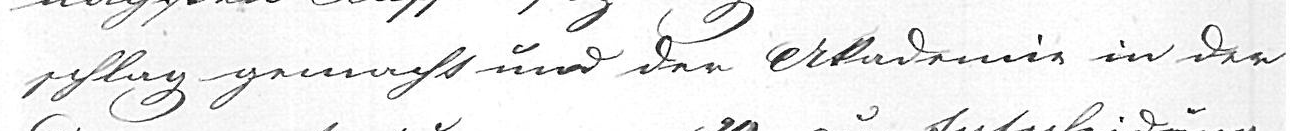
schlag gemacht und der Akademie in der
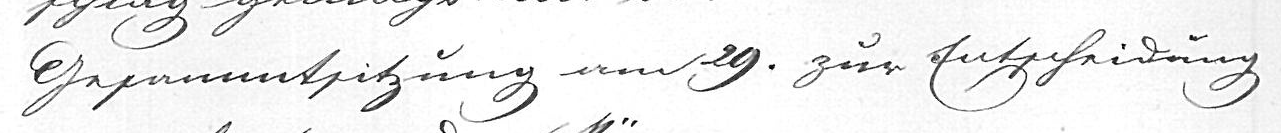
Gesammtsitzung am 29. zur Entscheidung
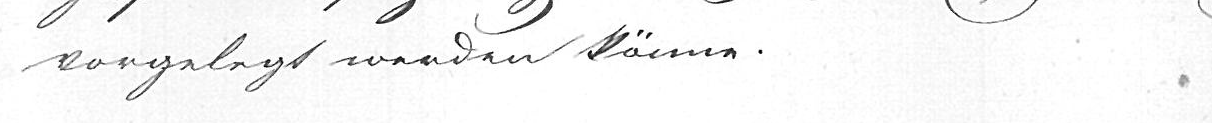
vorgelegt werden könne.
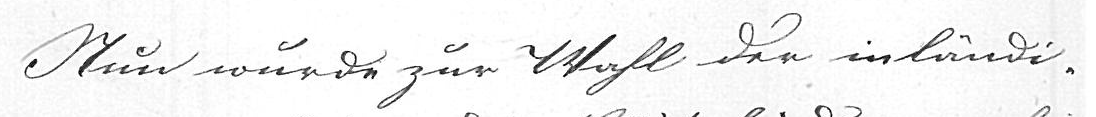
Nun wurde zur Wahl der inländi-
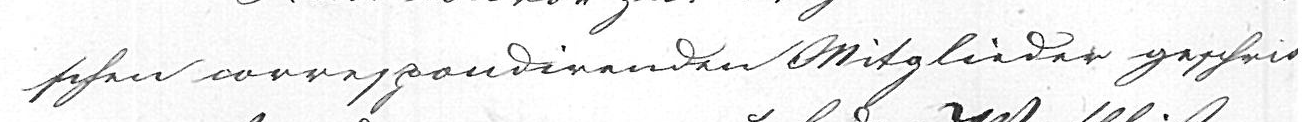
schen correspondirenden Mitglieder geschrit-
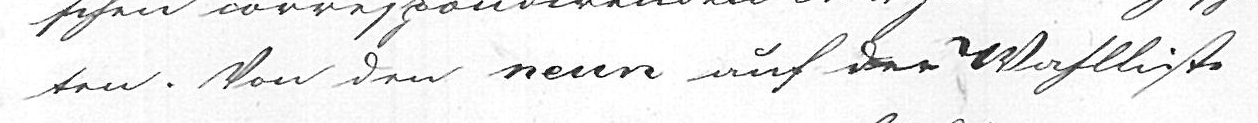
ten. Von den neun auf der Wahlliste
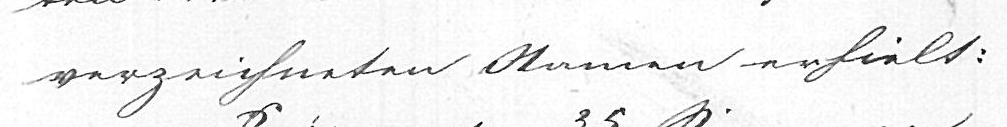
verzeichneten Namen erhielt:
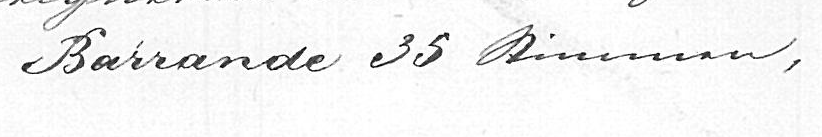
Barrande 35 Stimmen,
